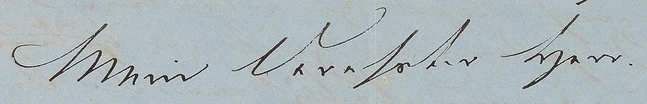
Mein Verehrter Herr.
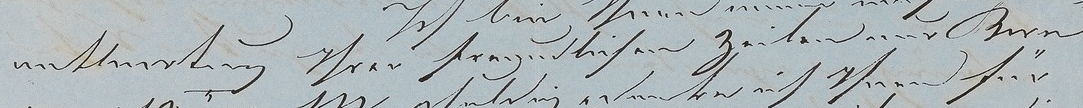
antwortung Ihrer freundlichen Zeilen aus Bern
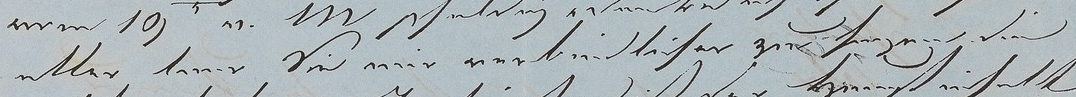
alles was Sie mir verbindliches zu sagen die
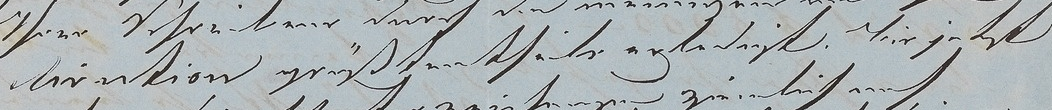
direction größtentheils erledigt. Bis jetzt
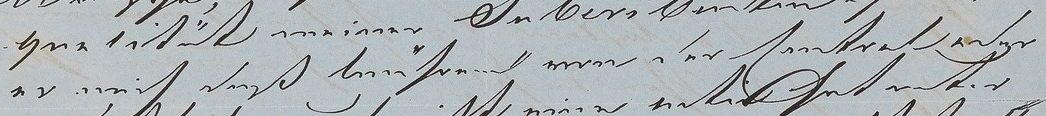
es mich daß während von der Central & der
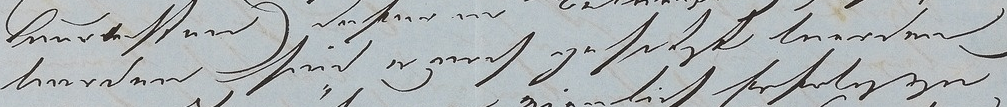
worden sind & noch gesetzt werden
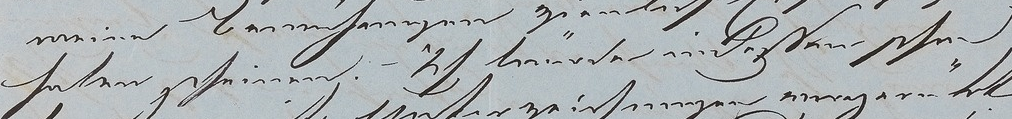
haben scheinen. – Ich würde indeßen schon
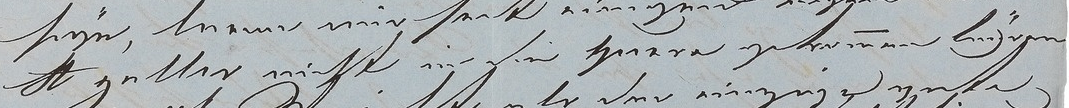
St galler nicht in die Quere gekommen wären
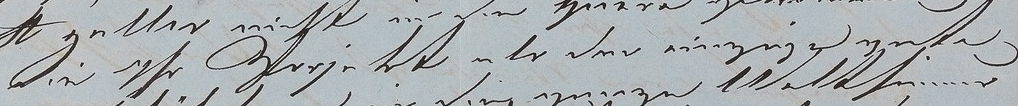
die Ihr Projekt als das einzige gute
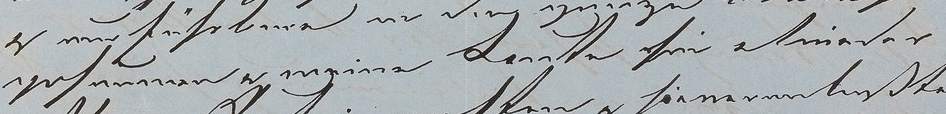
posaunen & meine Leute hin & wieder
